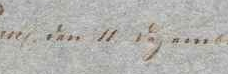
Bern, den 11. Dezember
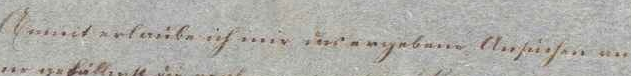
Anmit erlaube ich mir das ergebene Ansuchen an
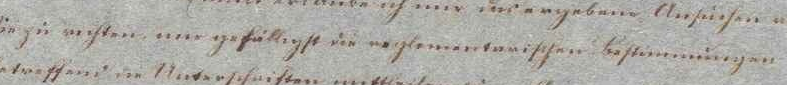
Sie zu richten, mir gefälligst die reglementarischen Bestimmungen
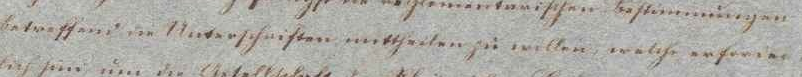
betreffend die Unterschriften mittheilen zu wollen, welche erforder-
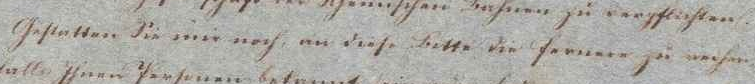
Gestatten Sie mir noch, an diese Bitte die fernere zu reihen,
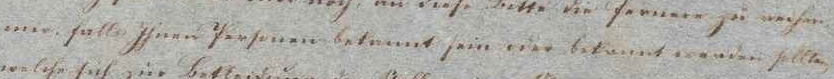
mir, falls Ihnen Personen bekannt sein oder bekannt werden sollten,
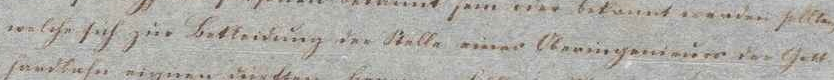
welche sich zur Bekleidung der Stelle eines Oberingenieurs der Gott-
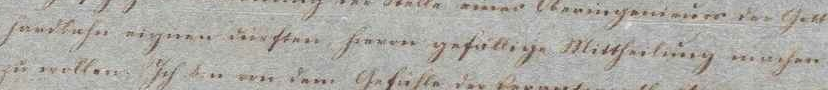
hardbahn eignen dürften, hievon gefällige Mittheilung machen
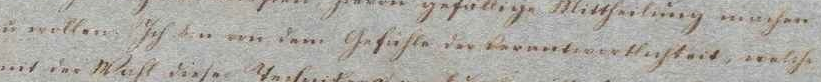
zu wollen. Ich bin von dem Gefühle der Verantwortlichkeit, welche
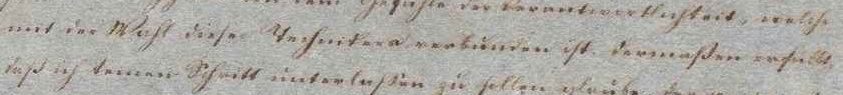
mit der Wahl dieses Technikers verbunden ist, dermaßen erfüllt,
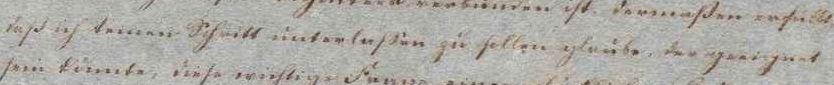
daß ich keinen Schritt unterlassen zu sollen glaube, der geeignet
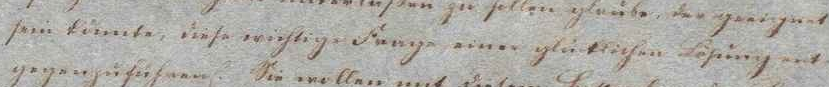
sein könnte, diese wichtige Frage einer glücklichen Lösung ent-
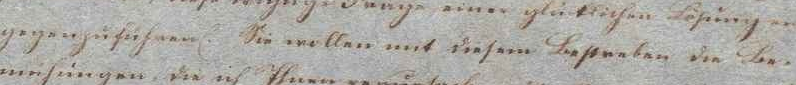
gegenzuführen. Sie wollen mit diesem Bestreben die Be-
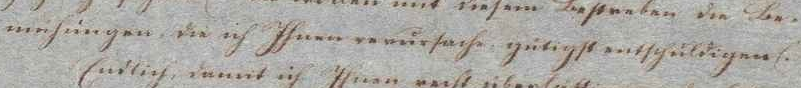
mühungen, die ich Ihnen verursache, gütigst entschuldigen.
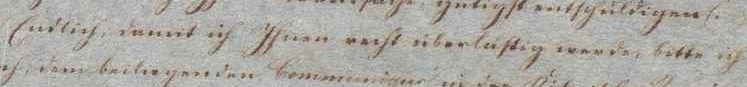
Endlich, damit ich Ihnen recht überlästig werde, bitte ich
